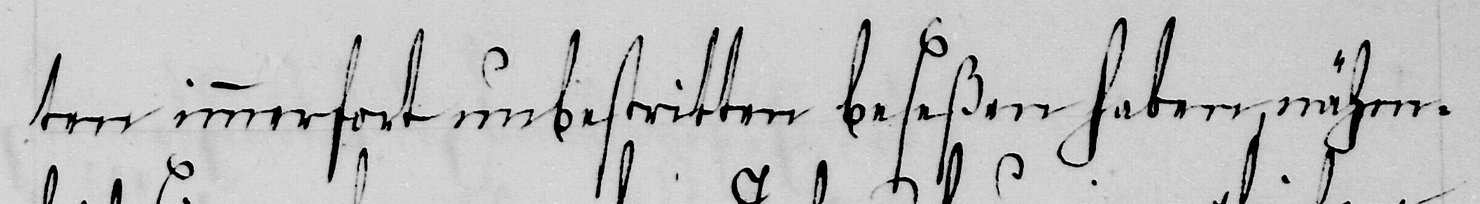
ten immerfort unbestritten beseßen haben, nähm¬
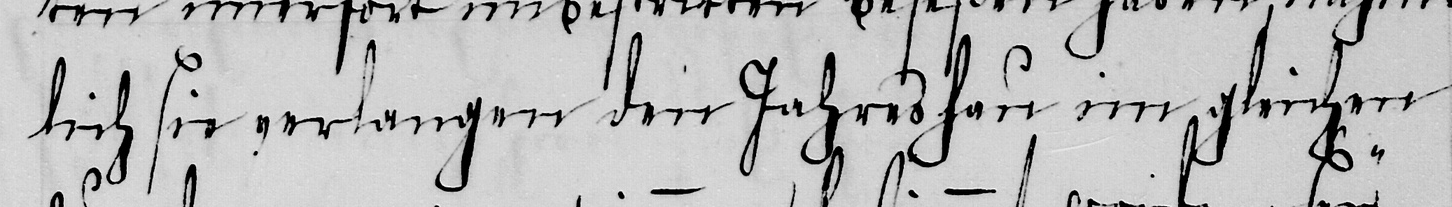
lich sie verlangen den Jahreshau im gleichen
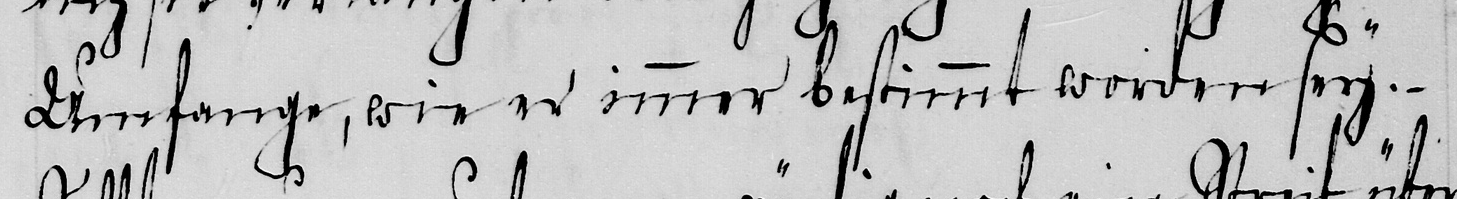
Umfange, wie er immer bestimmt worden sey.
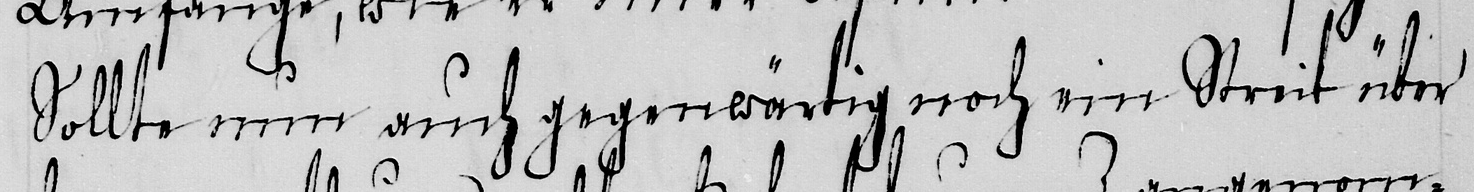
Sollte nun auch gegenwärtig noch ein Streit über
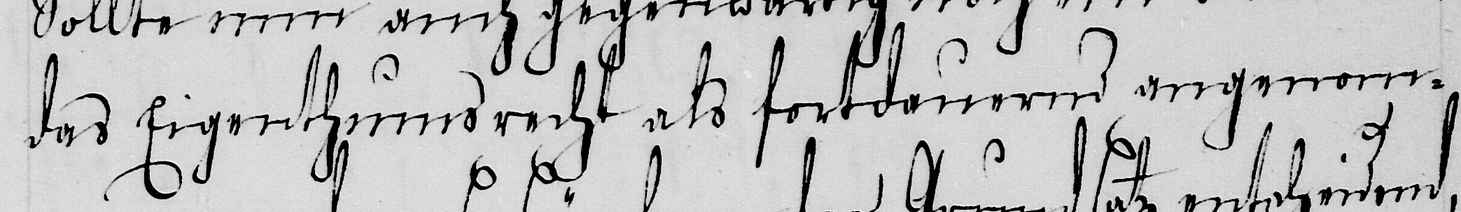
das Eigenthumsrecht als fortdauernd angenom¬
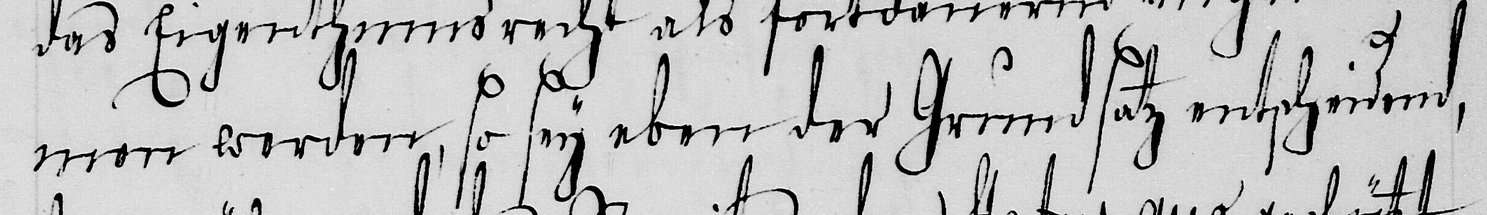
men werden, so sey eben der Grundsatz entscheiden¬
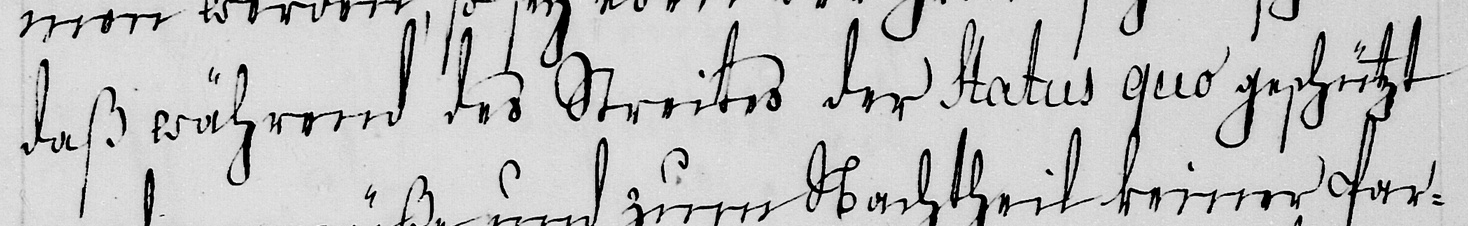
daß während des Streites der Status quo geschützt
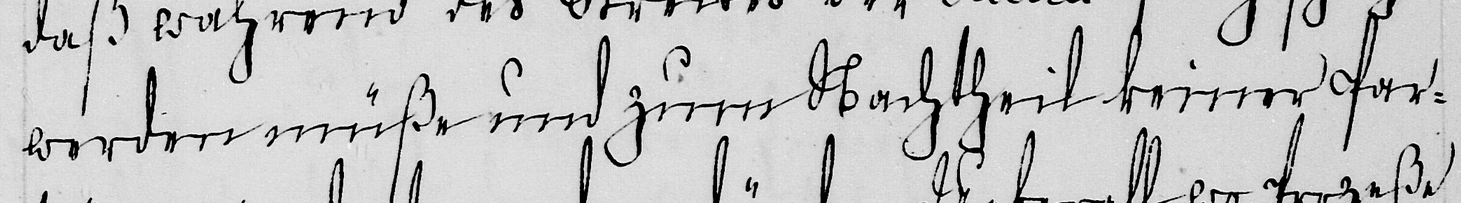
werden müße und zum Nachtheil keiner Par¬
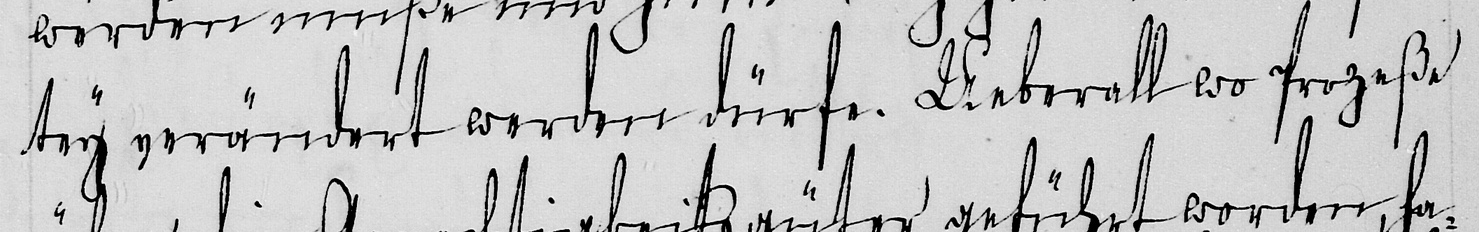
tey verändert werden dürfe. Ueberall wo Prozeße
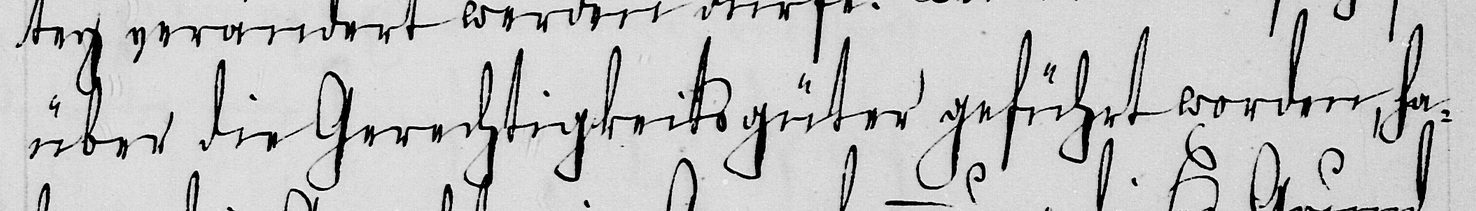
über die Gerechtigkeitsgüter geführt worden, ha¬
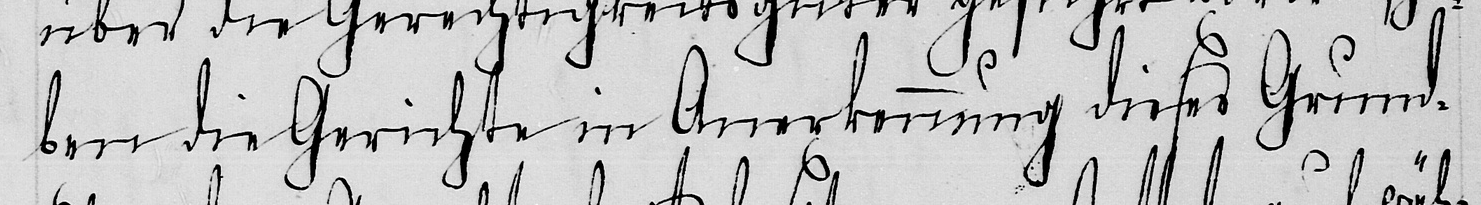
ben die Gerichte in Anerkennung dieses Grund¬
